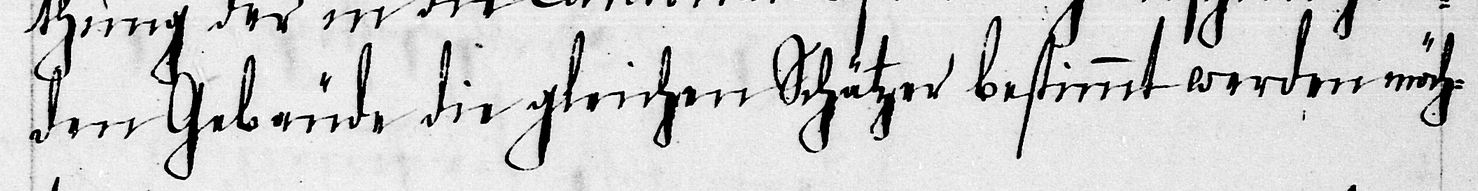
den Gebäude die gleichen Schätzer bestimmt werden möch¬
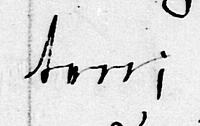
ten;
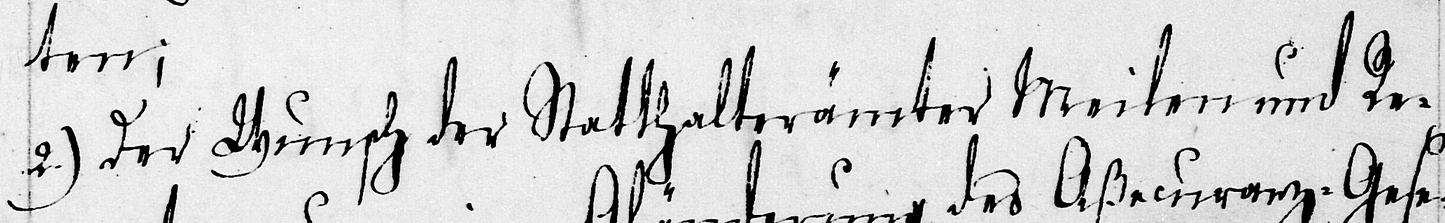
2.) Der Wunsch der Statthalterämter Meilen und Re¬
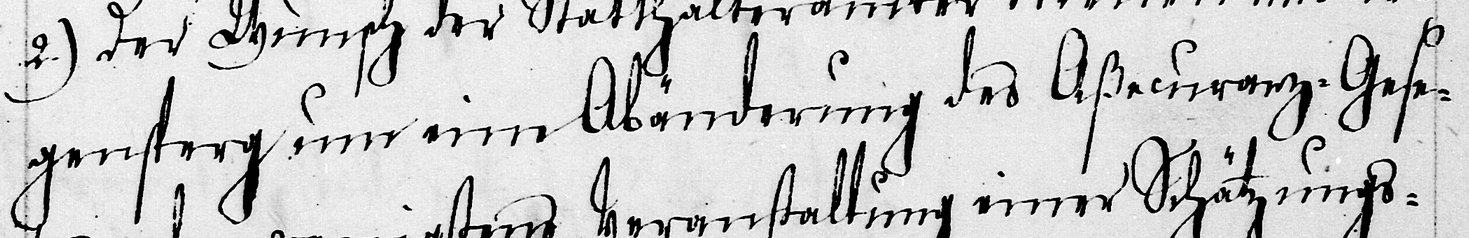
gensperg um eine Abänderung des Aßecuranz-Gese¬
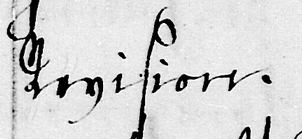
evision.
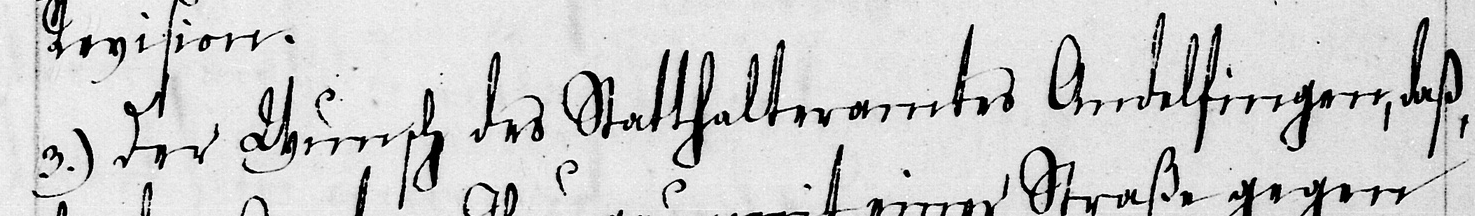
3.) Der Wunsch des Statthalteramtes Andelfingen, daß,
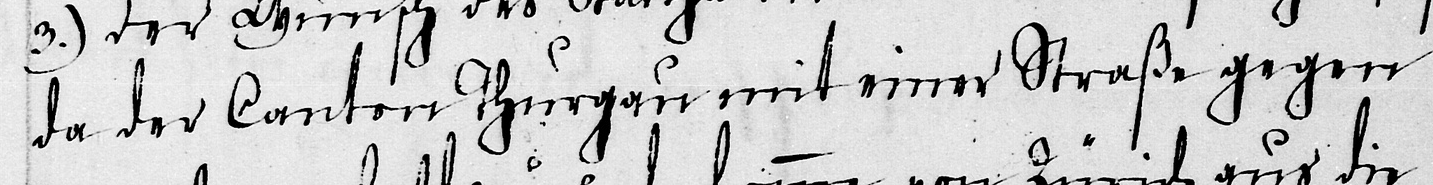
da der Canton Thurgau mit einer Straße gegen
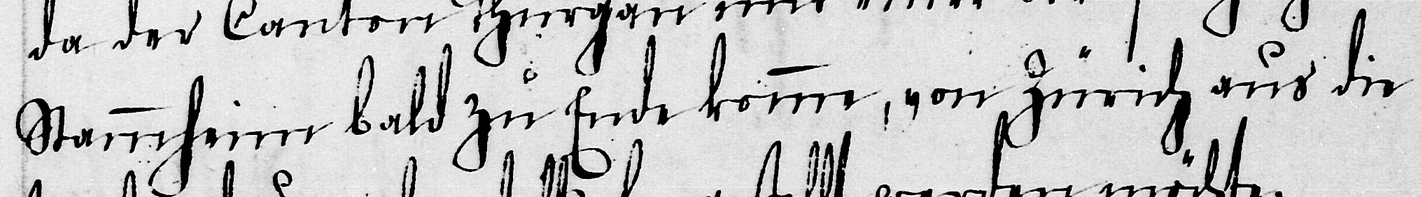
Stammheim bald zu Ende komme, von Zürich aus die
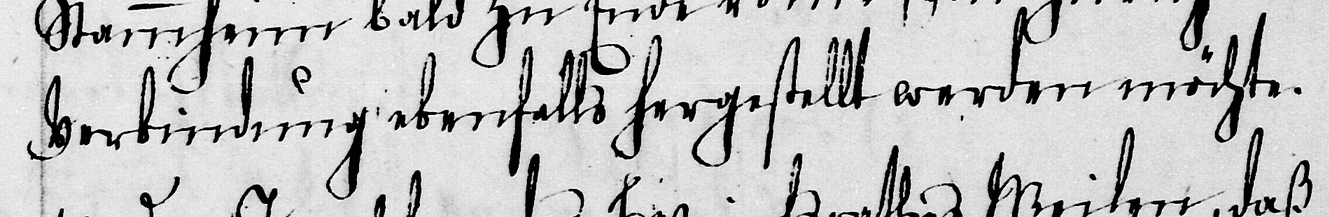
Verbindung ebenfalls hergestellt werden möchte.
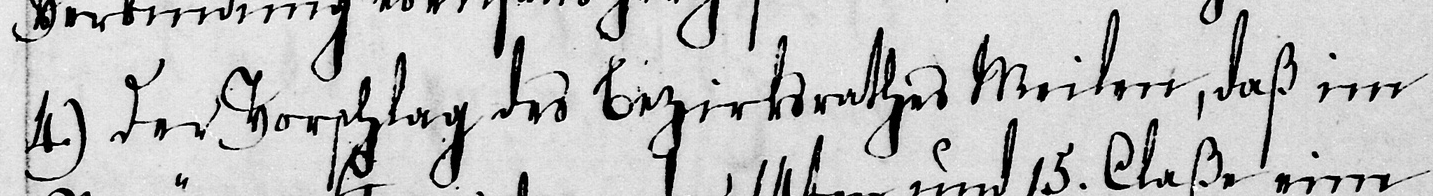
4.) Der Vorschlag des Bezirksrathes Meilen, daß im
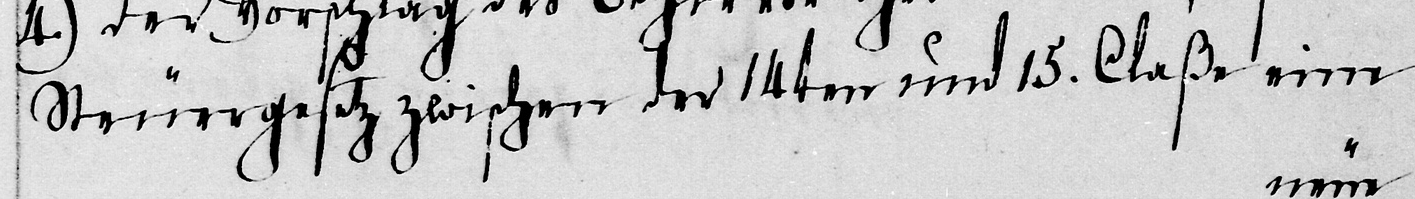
Steuergesetz zwischen der 14ten und 15. Claße eine
